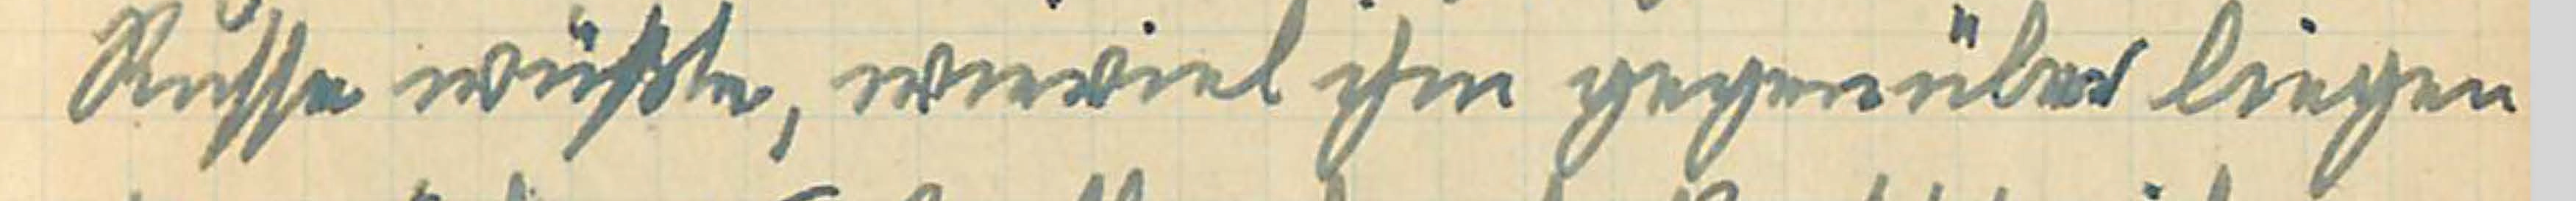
Russe wüßte, wieviel ihm gegenüber liegen,
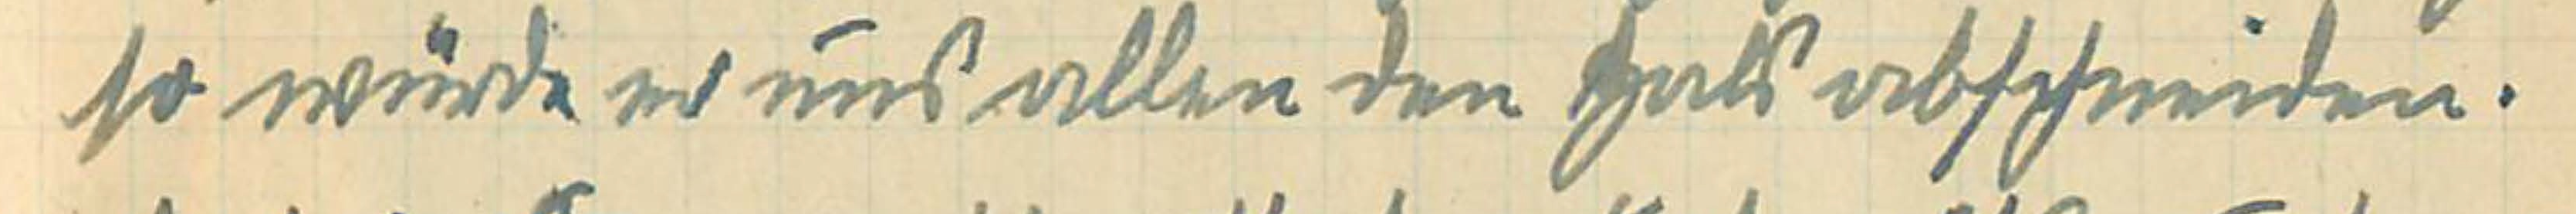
so würde er uns allen den Hals abschneiden.
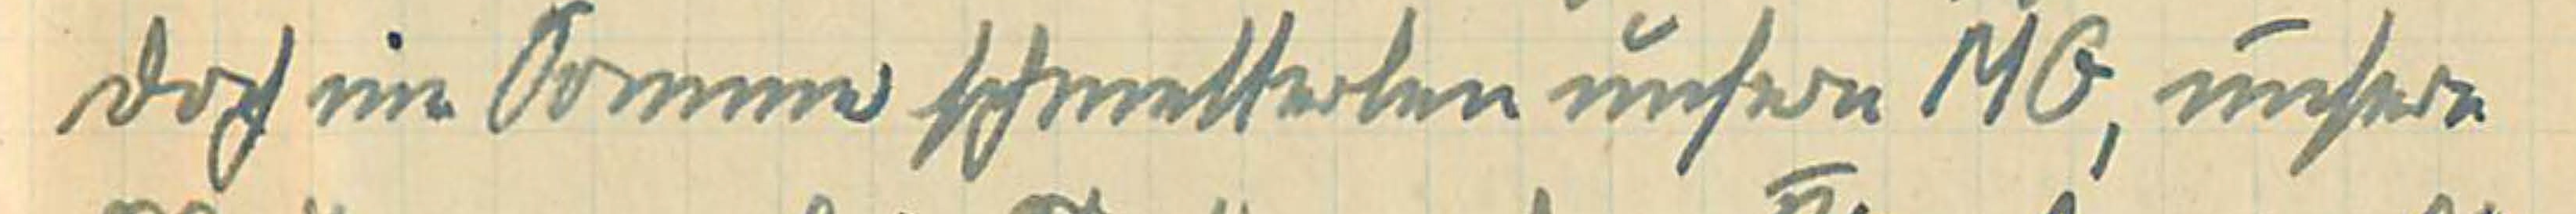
Doch im Sommer schmetterten unsere MG, unsere
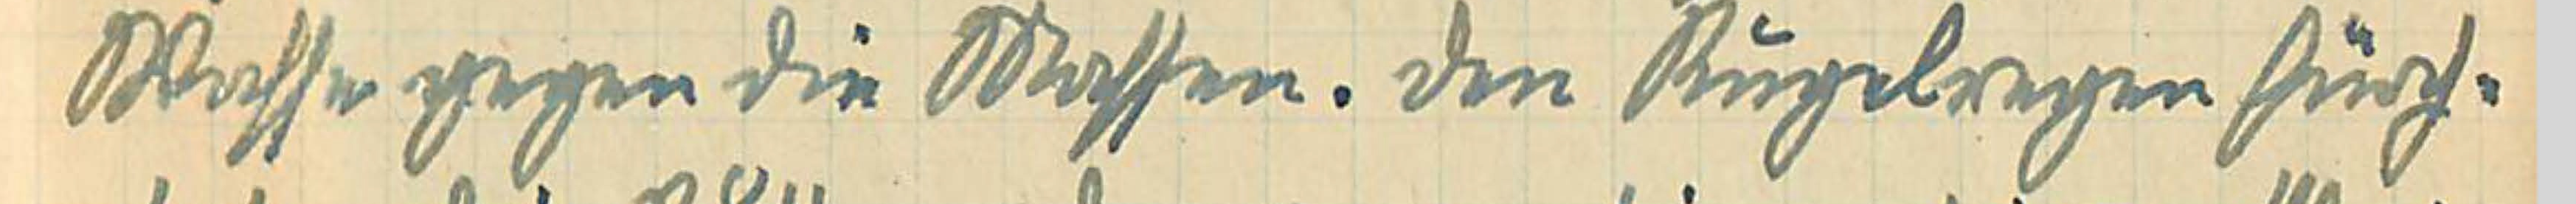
Waffe gegen die Massen. Den Kugelregen fürch-
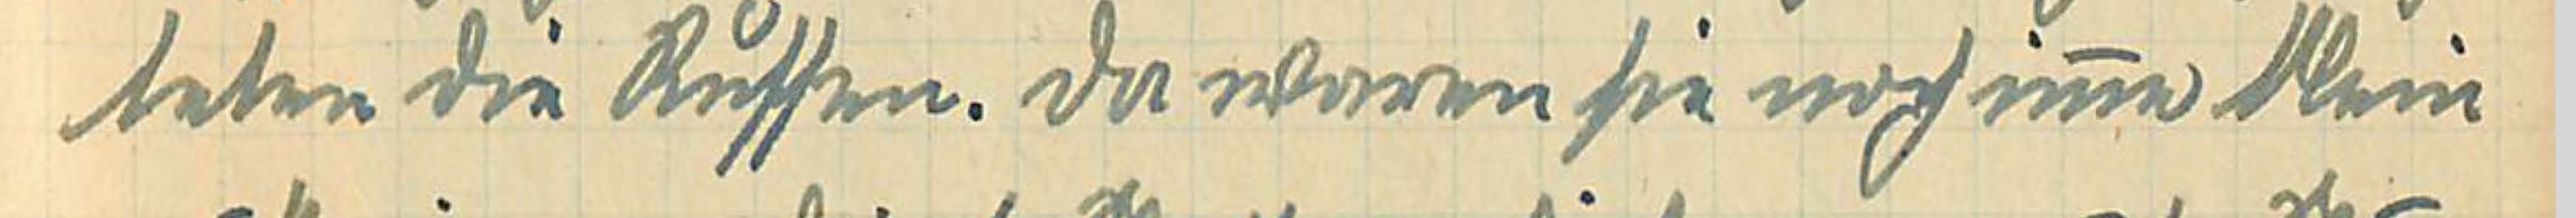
teten die Russen. Da waren sie noch immer klein
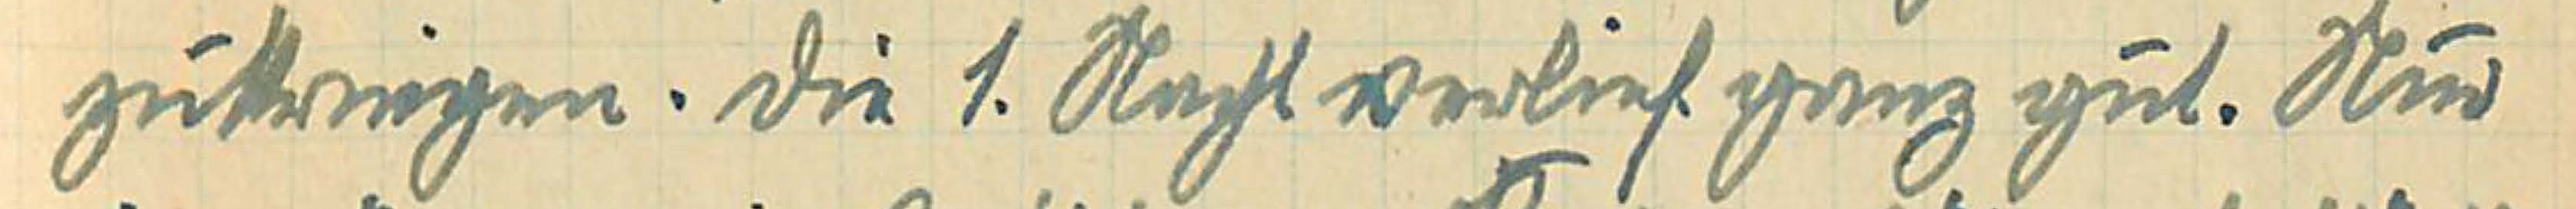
zukriegen. Die 1. Nacht verlief ganz gut. Nur
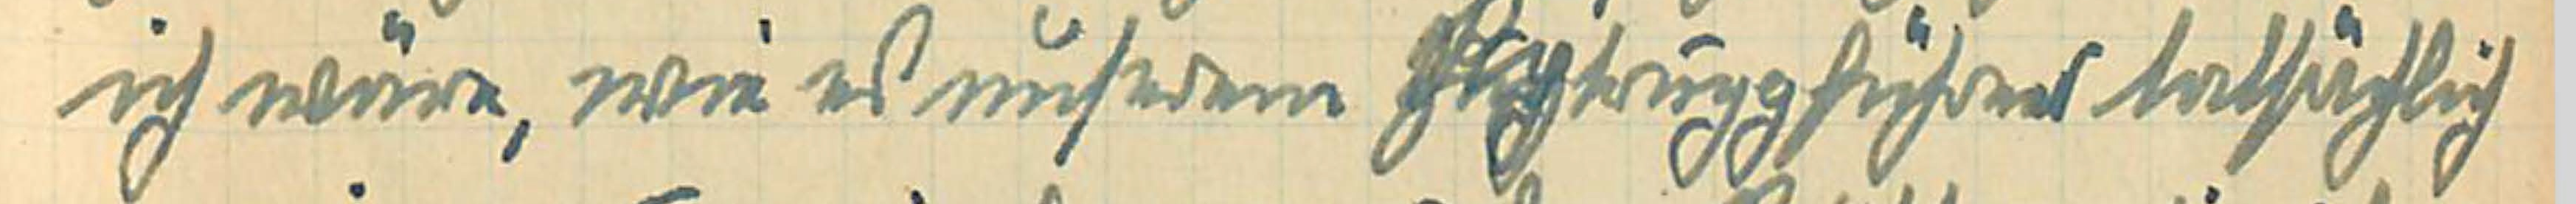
ich wäre, wie es unserem ZugRgtruppführer tatsächlich
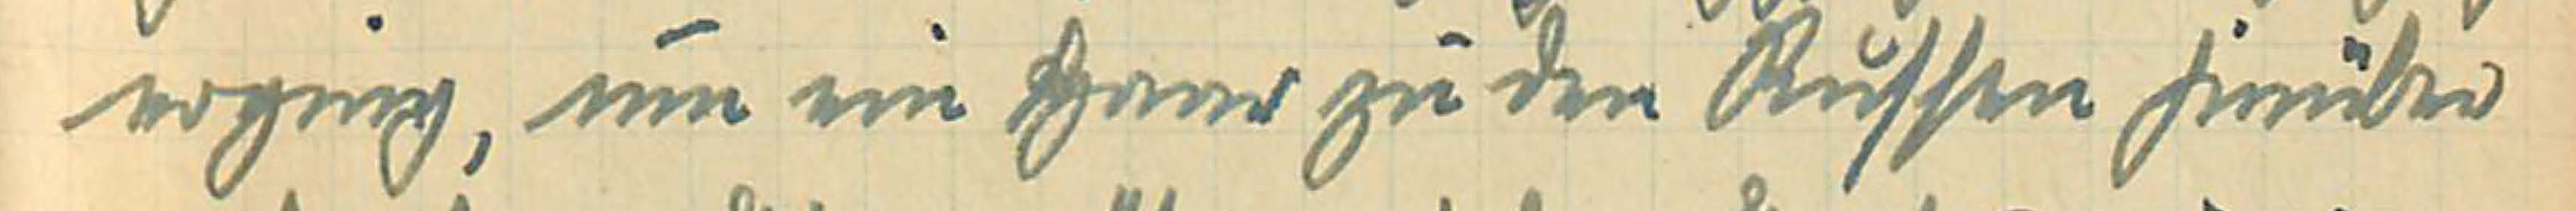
erging, um ein Haar zu den Russen hinüber
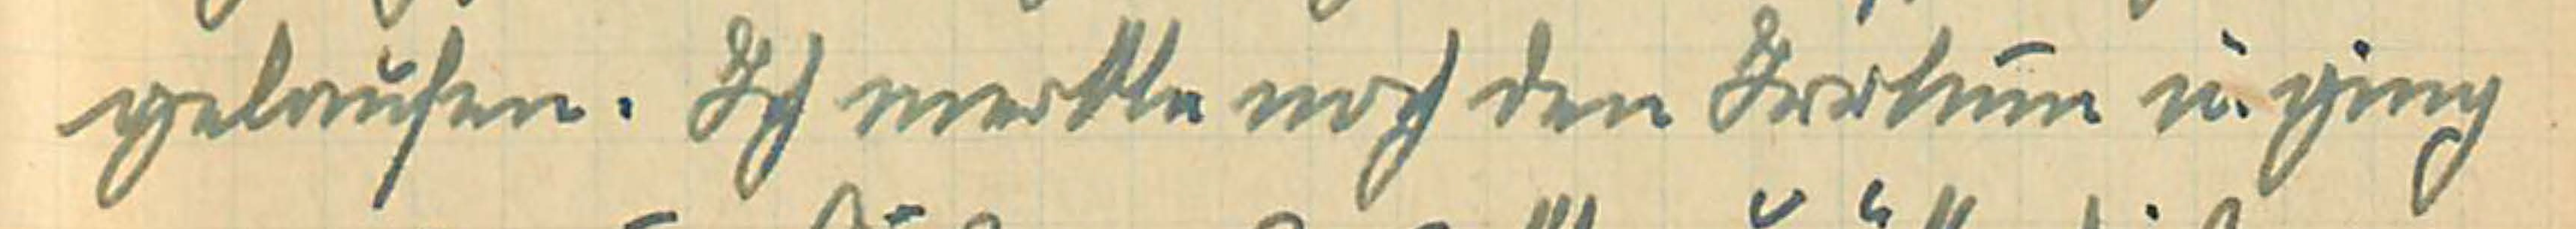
gelaufen. Ich merkte noch den Irrtum u. ging
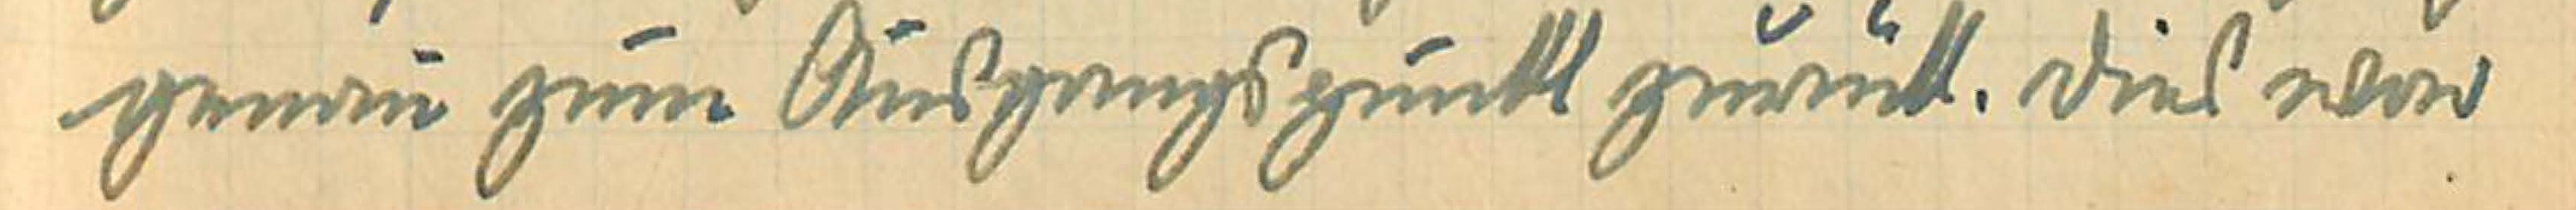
genau zum Ausgangspunkt zurück. Dies war
